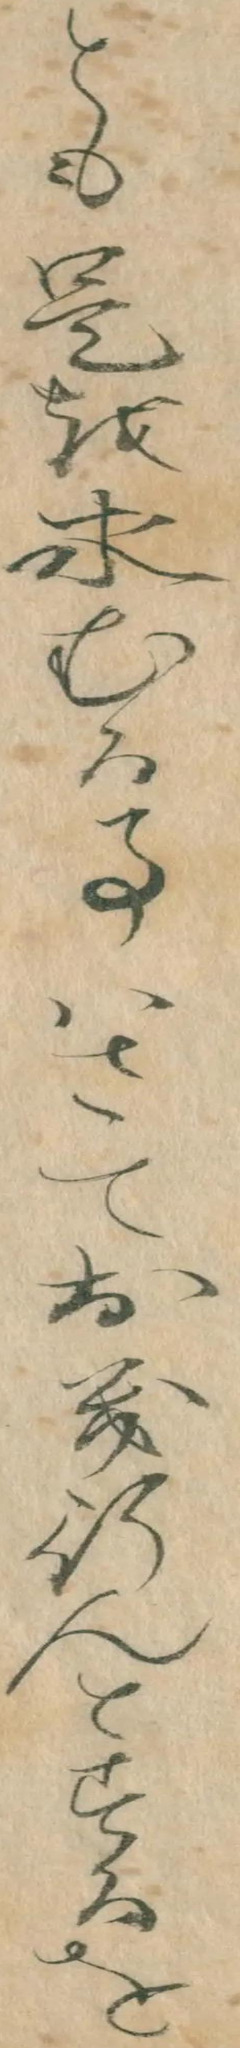とも是を求むる事はさておき行んとするを
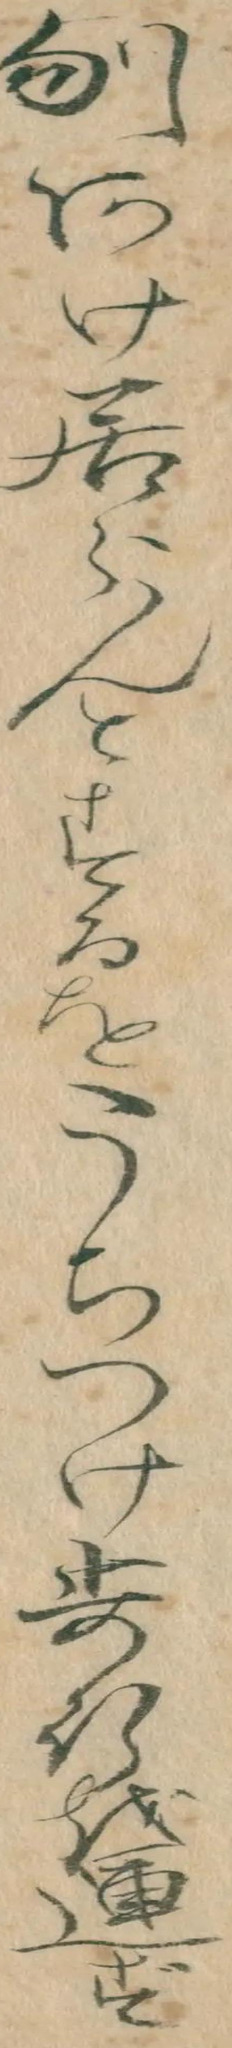刎あけ居らんとするをうちつけ歩行を運ず
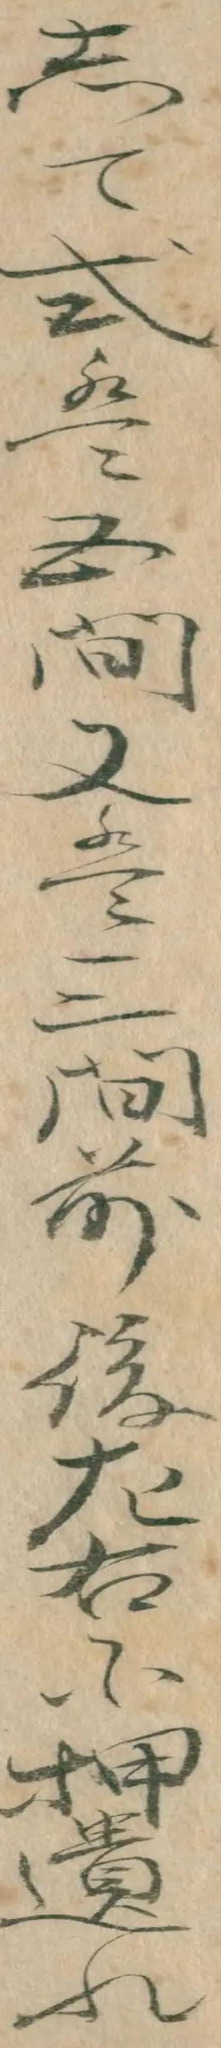して或は五間又は三間前後左右に押遺れ
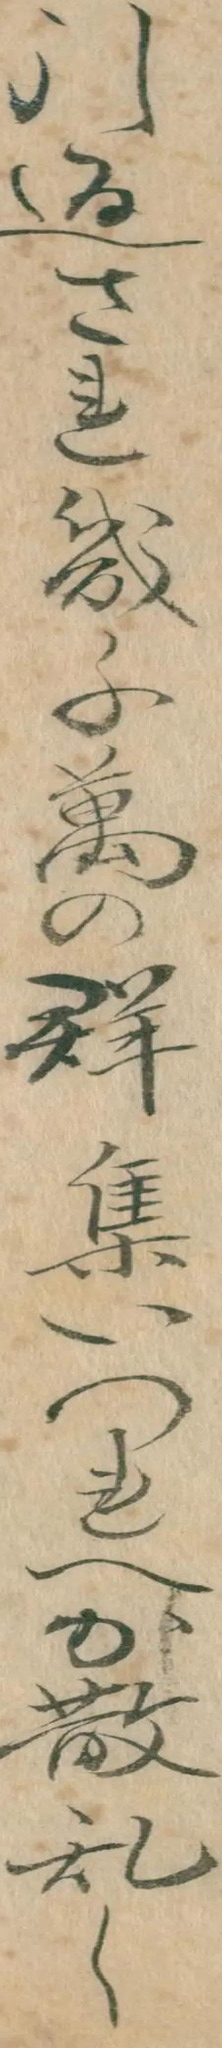引返され幾千万の群集いつれへか散乱し
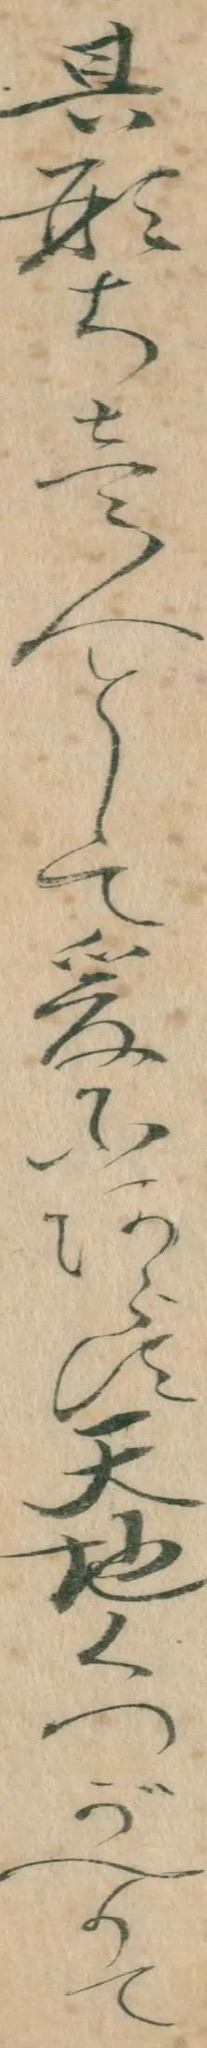其形ち壱人として爰にあらす天地くつがへりて
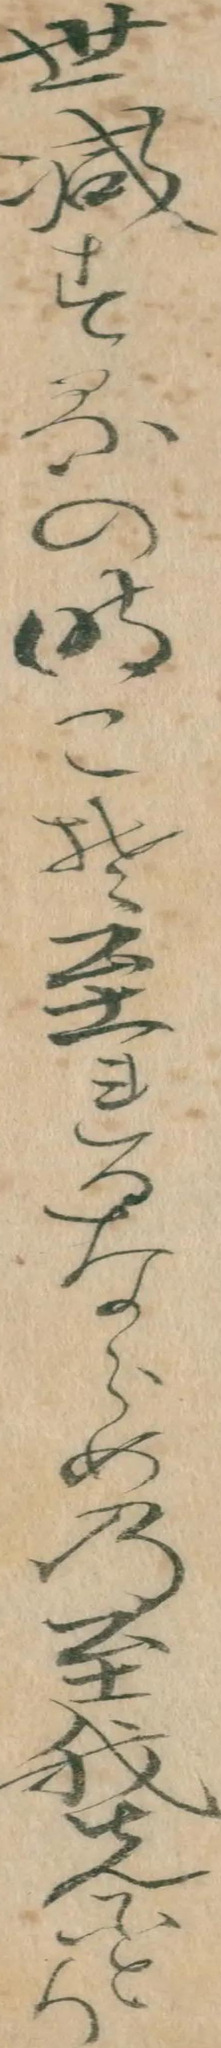世減するの時こそ至れるならめ乃至我先にとり
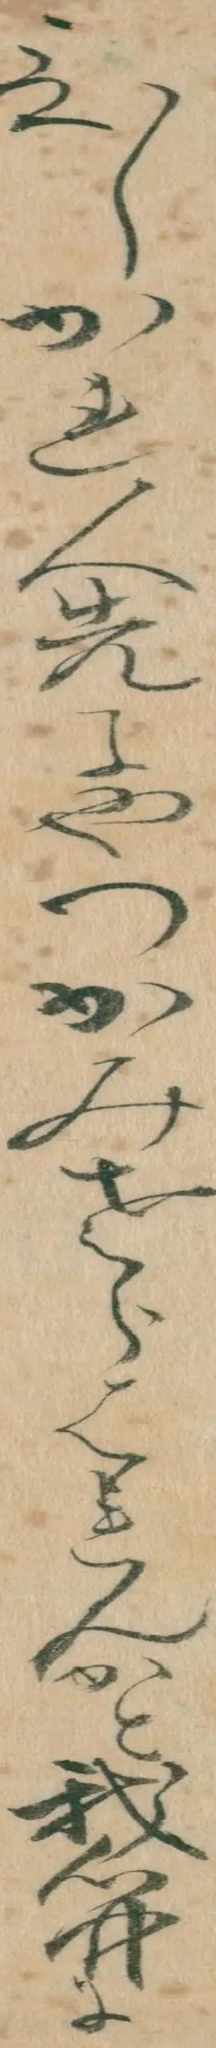ひしかれ人先にやつかみさらはれんかと我心中に
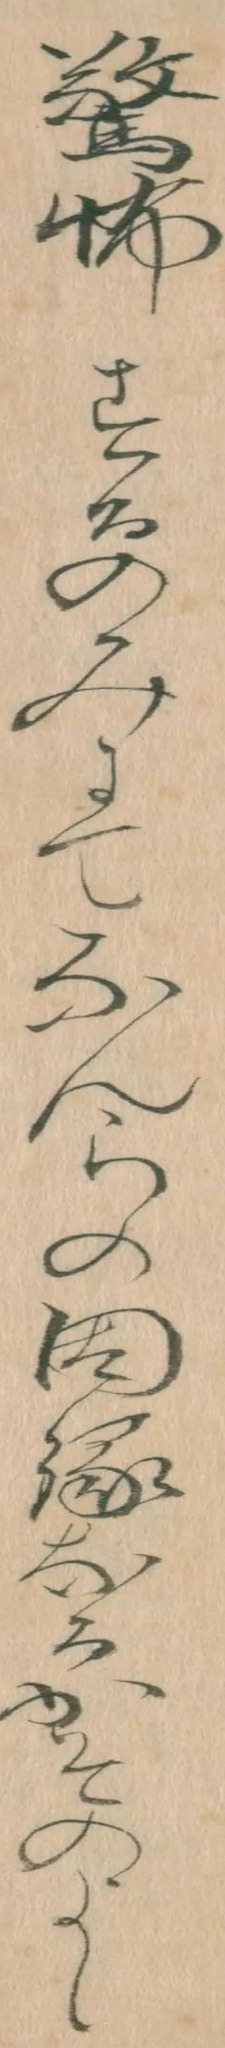驚怖するのみにてなんらの因縁なるかそのよし
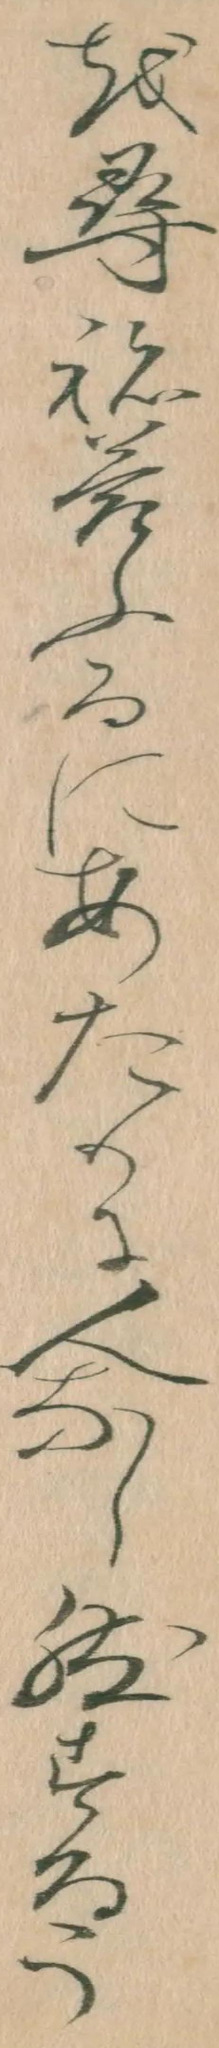を尋ね答ふるにあたりに人なし然するう
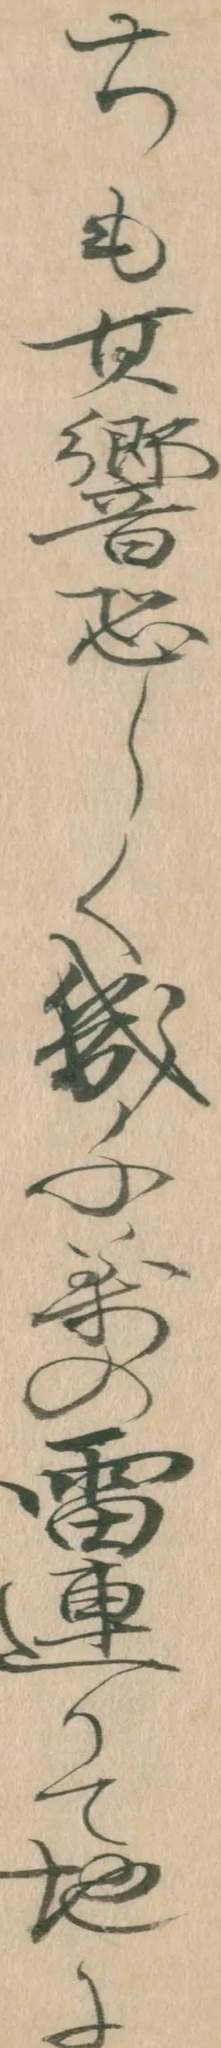ちも其響恐しく幾千万の雷連りて地に
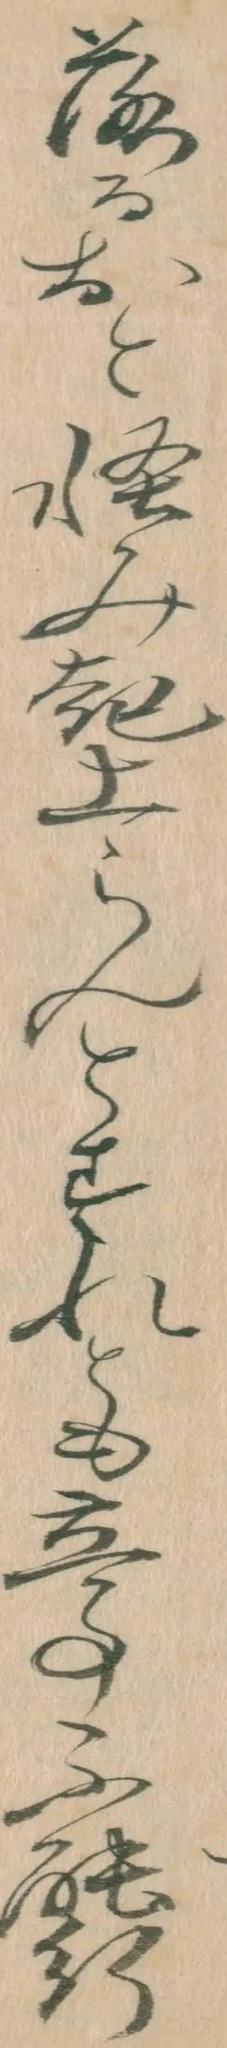落るおと怪み起上らんとすれとも立事不能行
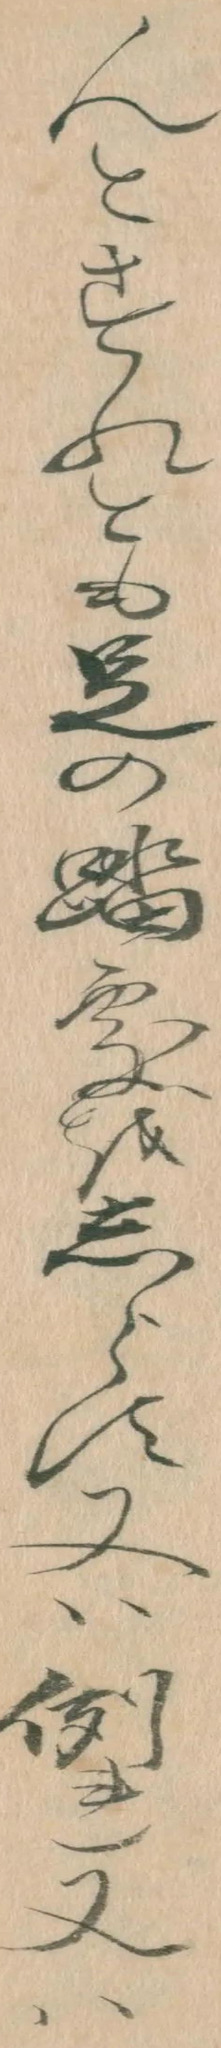んとすれとも足の踏処をしらす又は倒れ又は
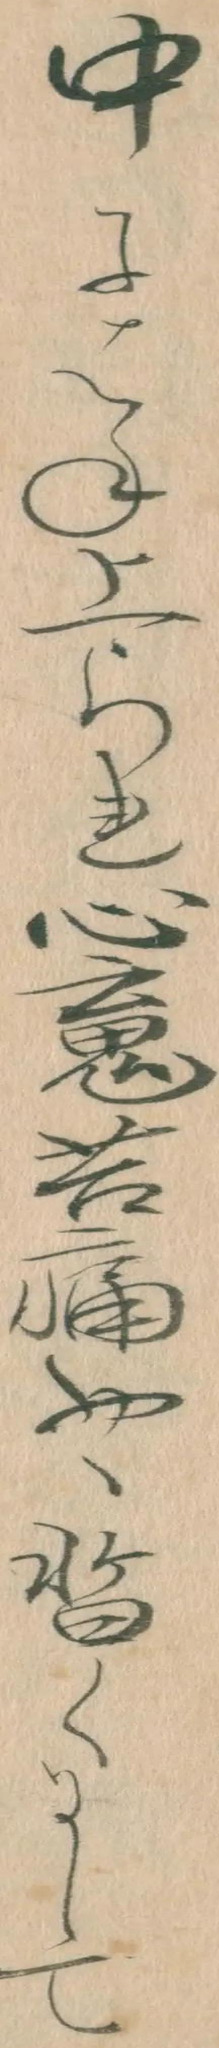中にはね上られ心魂苦痛やゝ暫くにして
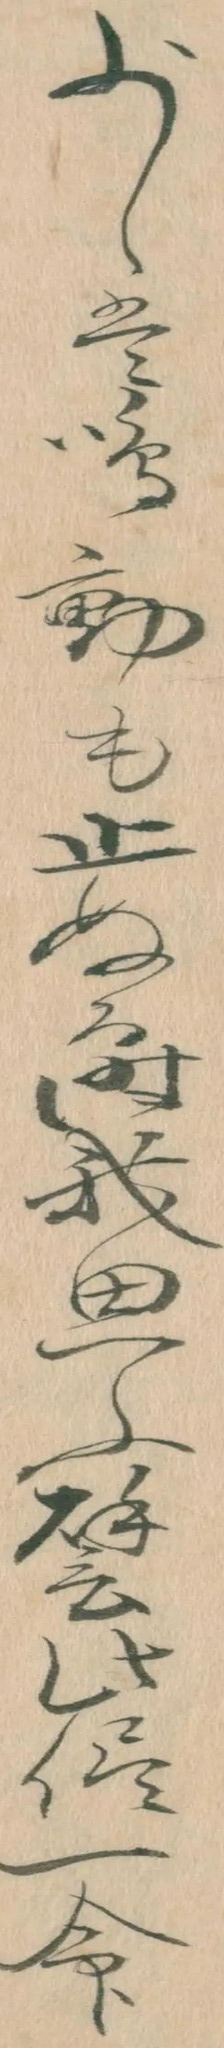少しは鳴動も止ぬる時は我思ふ譬此侭一命
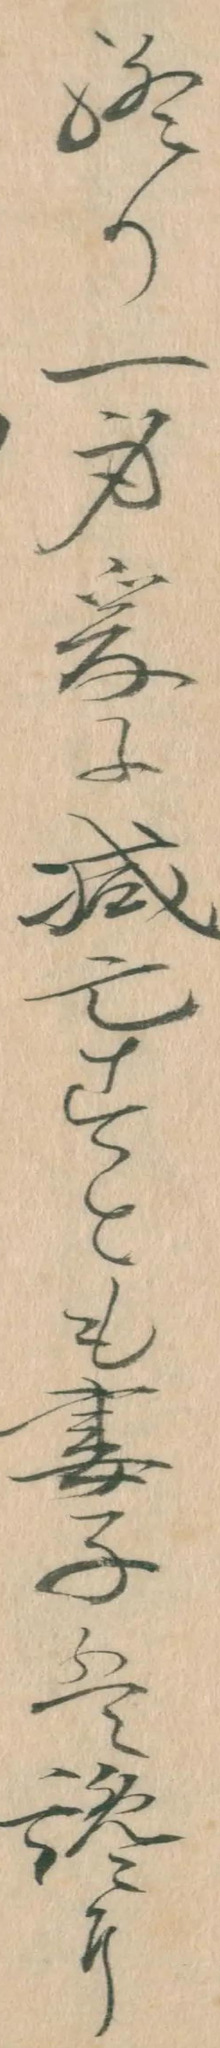終り一身爰に滅亡すとも妻子は纔に
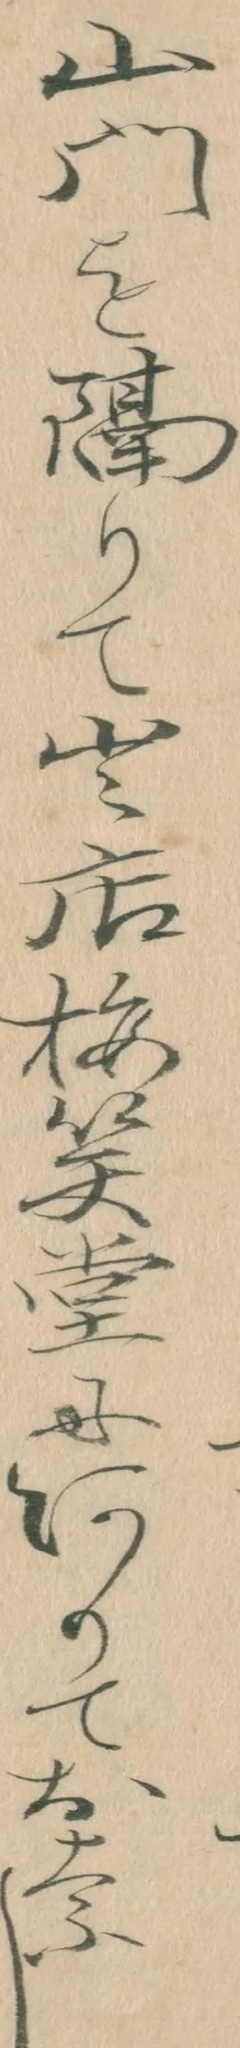山門を隔りて出店梅笑堂にありておなし
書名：俗語之種. [3]
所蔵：国立国会図書館 National Diet Library, JAPAN
